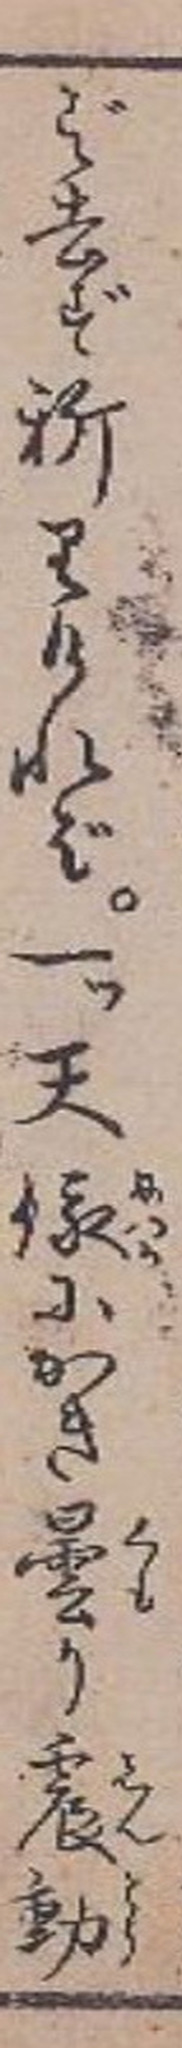ず去ず祈りければ、一天俄にかき曇り震動
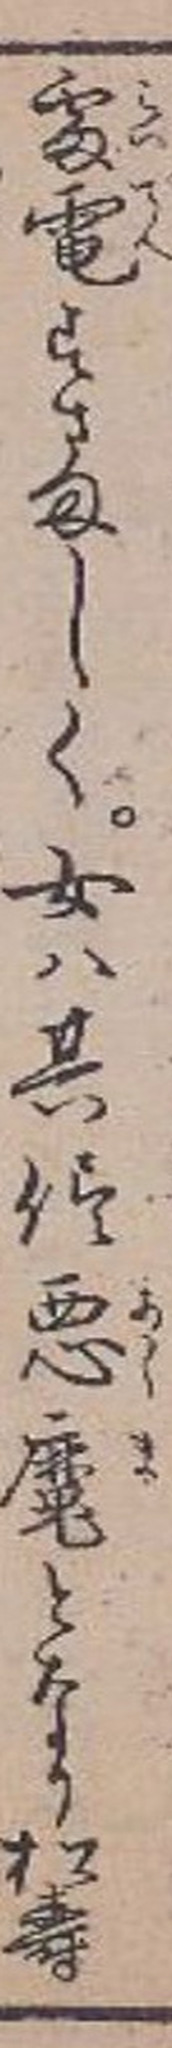雷電すさましく、女は其儘悪魔となり松寿
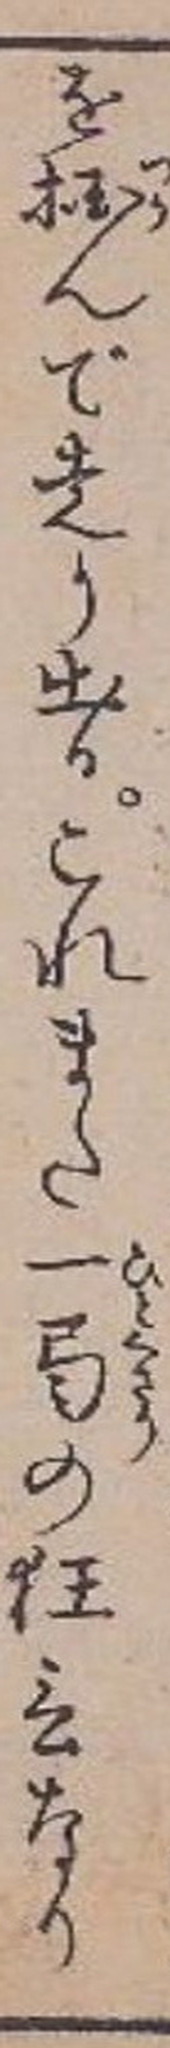を掴んで走り出る、これまた一局の狂言なり
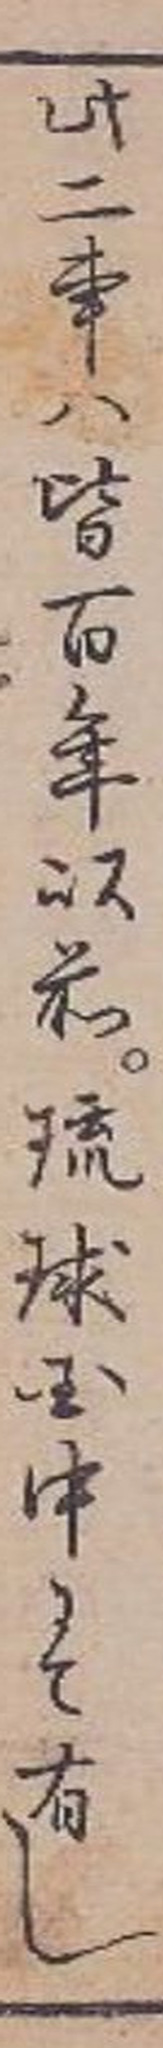此二事は皆百年以前、琉球国中にて有し
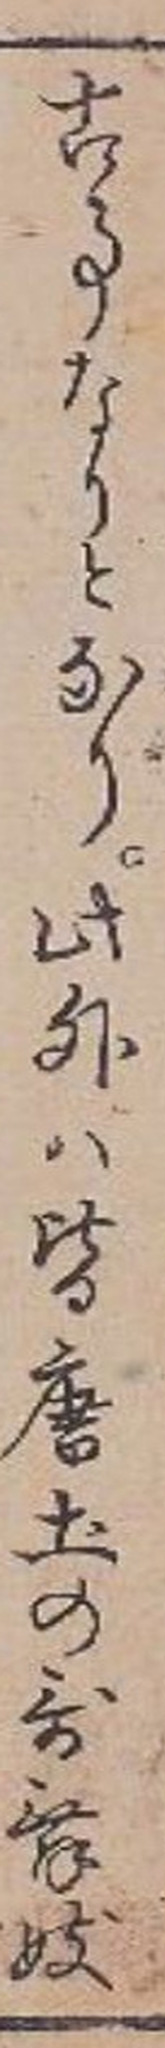古事なりとなり、此外は皆唐土の歌舞妓
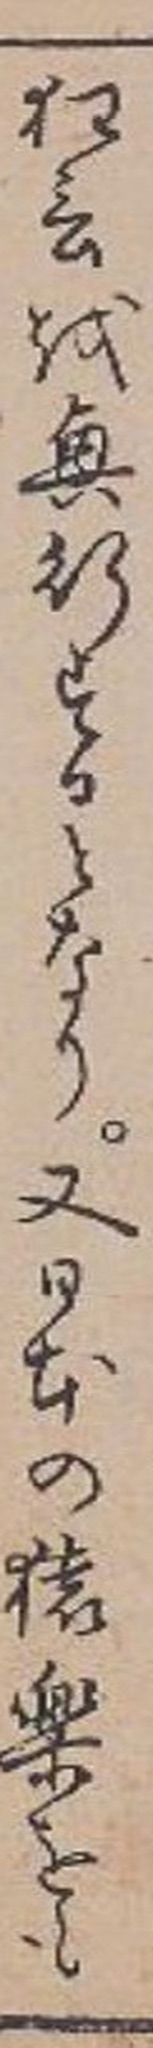狂言を興行するとなり、又日本の猿楽をも
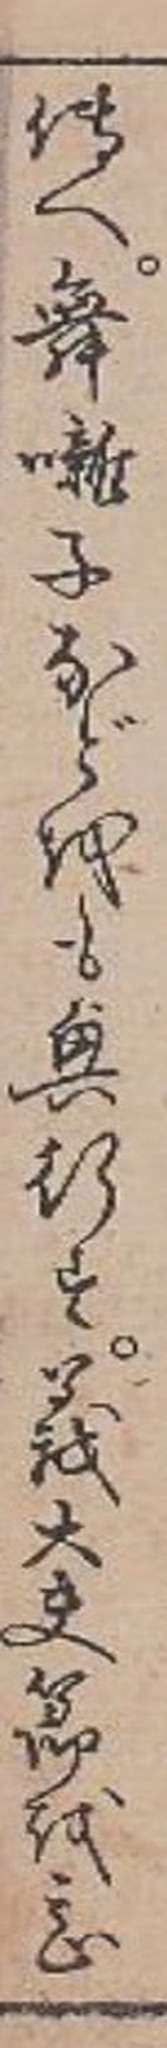伝へ、舞囃子などをも興行す、義太夫節を甚
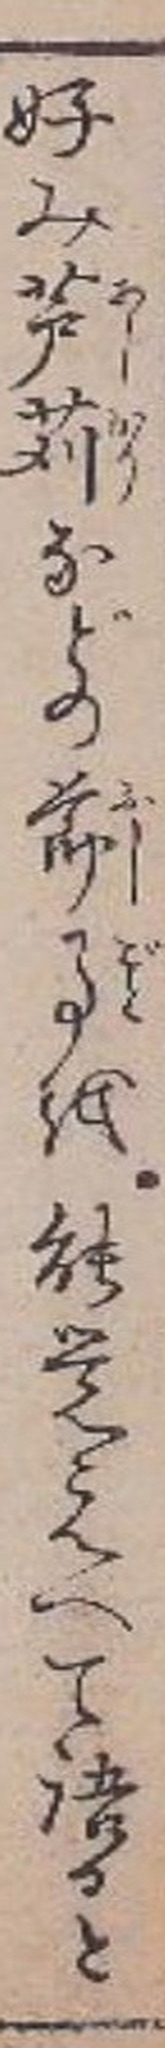好み芦苅などの節事を、能覚えへて語ると
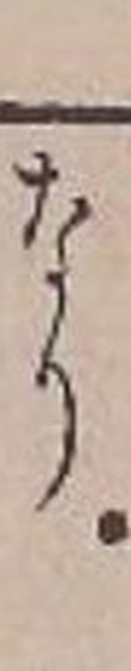なり、
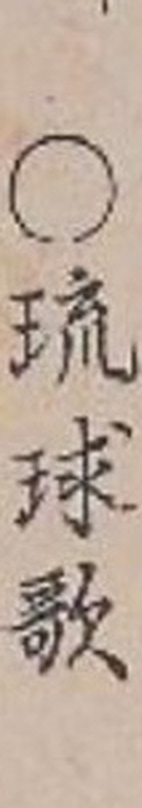〇琉球歌
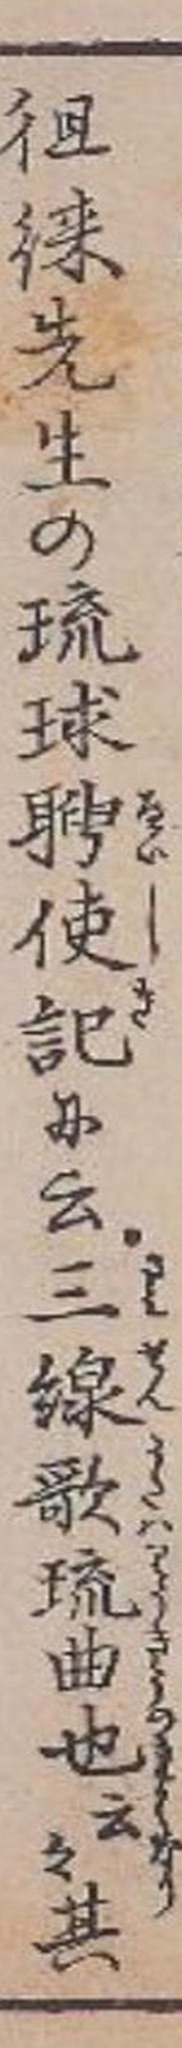徂徠先生の琉球聘使記に云、三線歌琉曲也云云其
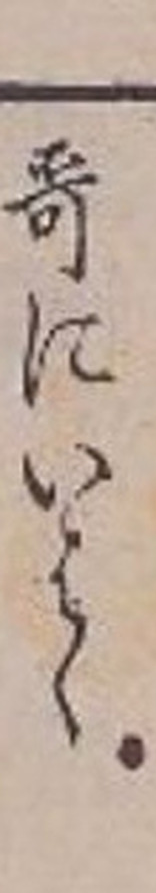哥にいはく、
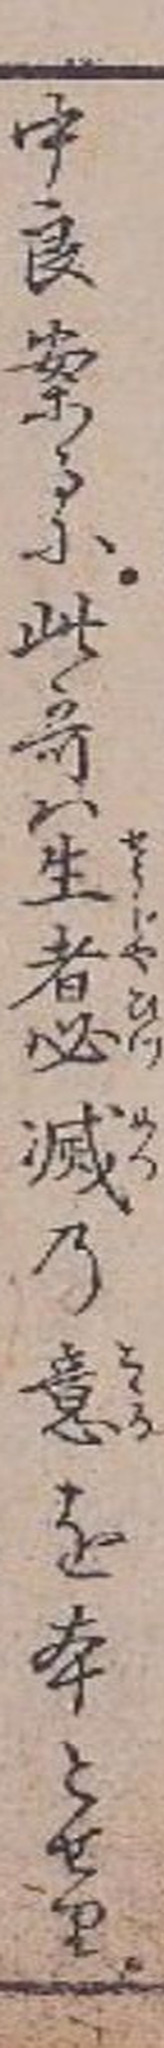中良案るに、此哥は生者必滅の意を本とせり、
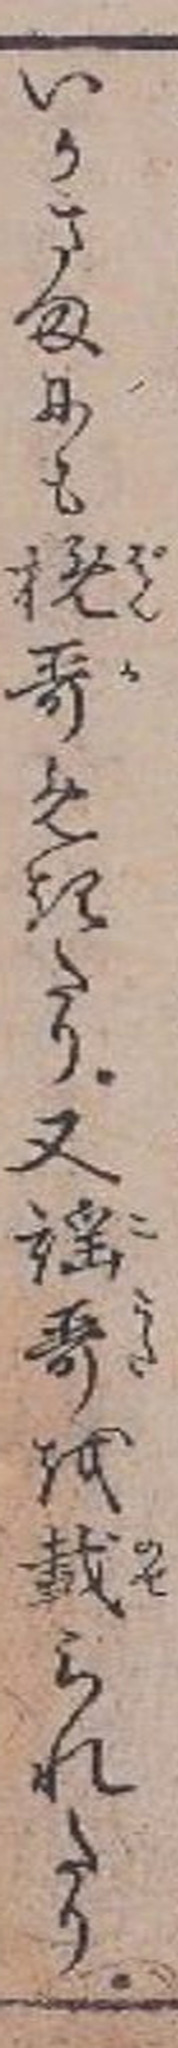いかさまにも挽哥めきたり、又謡哥を載られたり、

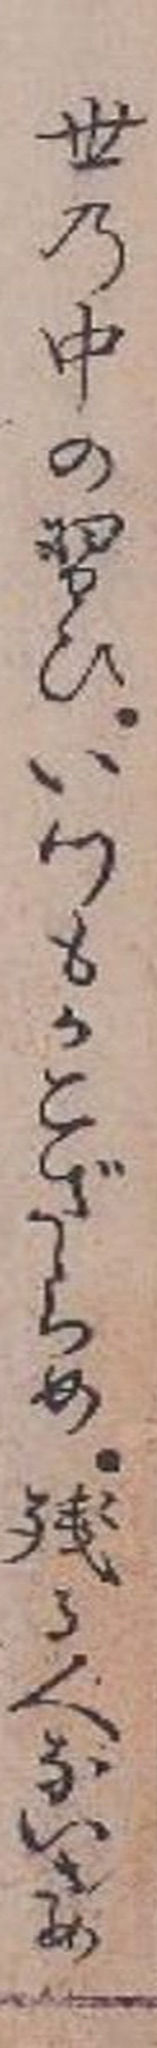世の中の習ひ、いつもかこざらめ、残る人ないさめ
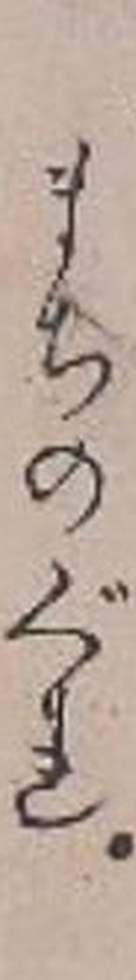まちのぐれ、
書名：琉球談
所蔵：University of the Ryukyus Library
